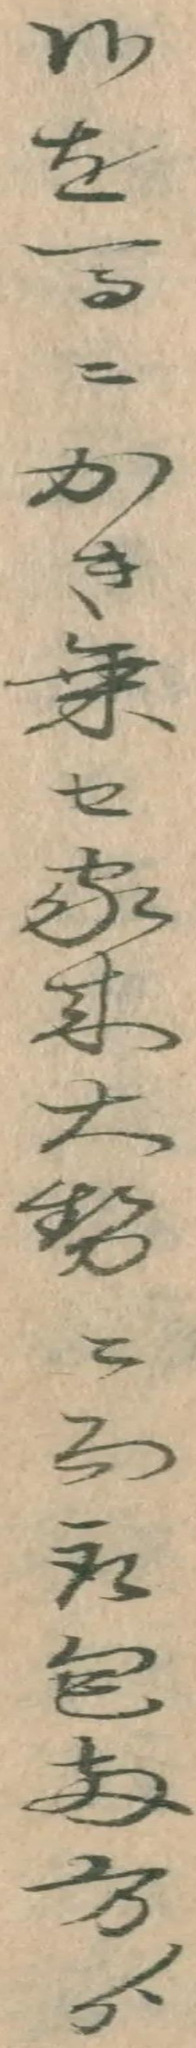候を馬にかき乗せ家来大勢に而取包両方ゟ

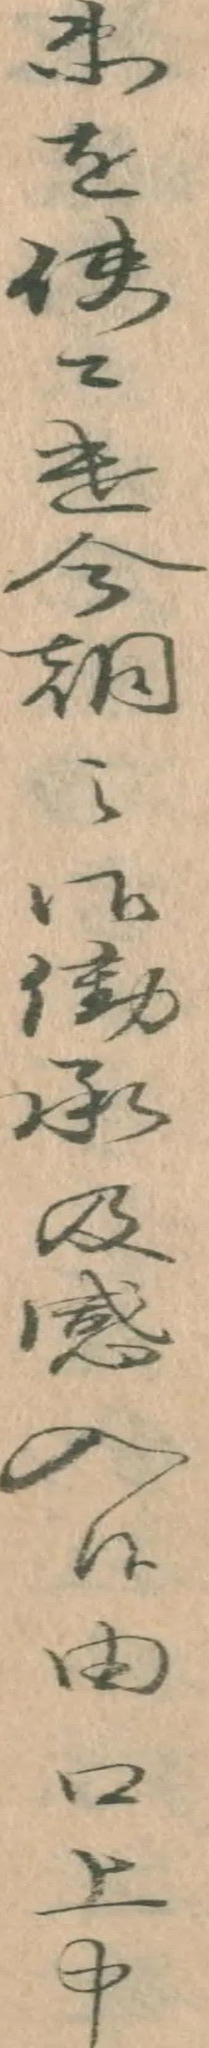米を使て遣今朝之御働承及感入候由口上申
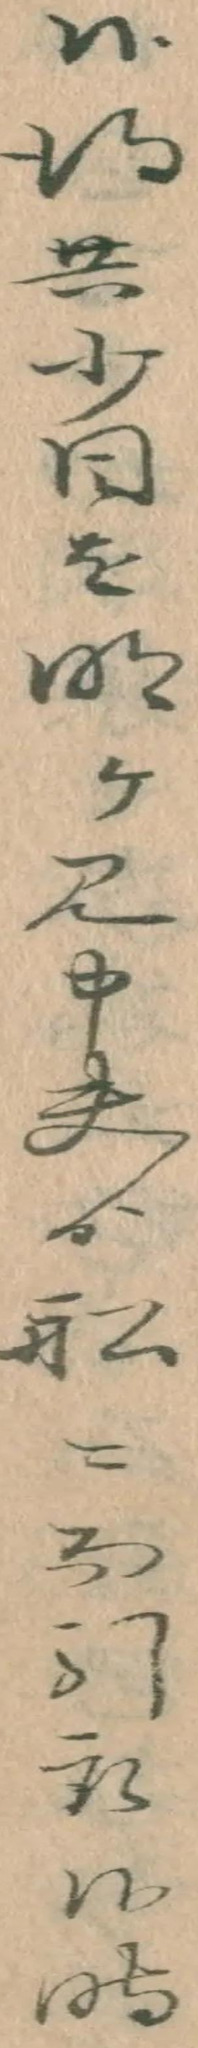候得共少日を明け見申夫ゟ舩に而引取候時
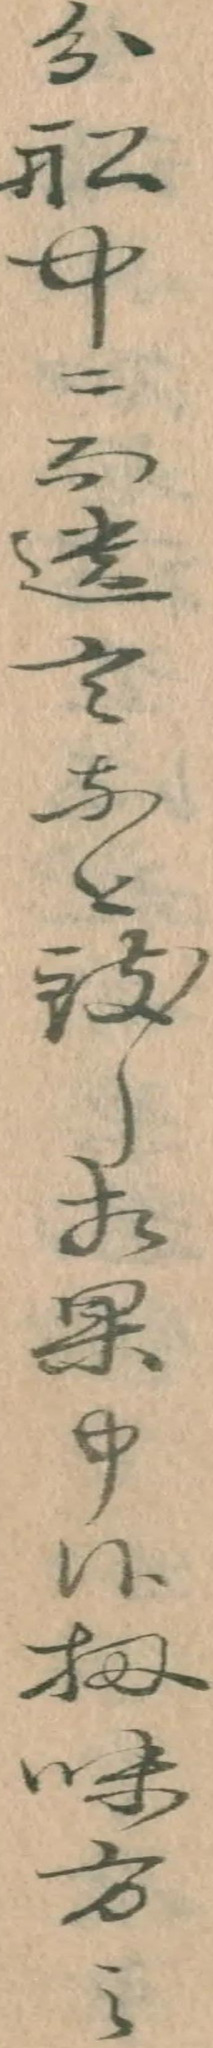分舩中に而遺言なと致し相果申候扨味方之
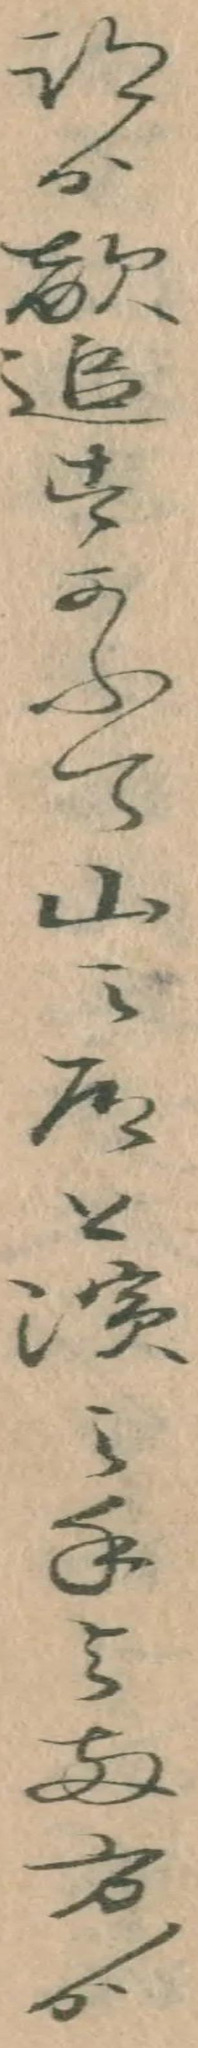跡ゟ敵追春可ふて山之道と浜之手与両方ゟ
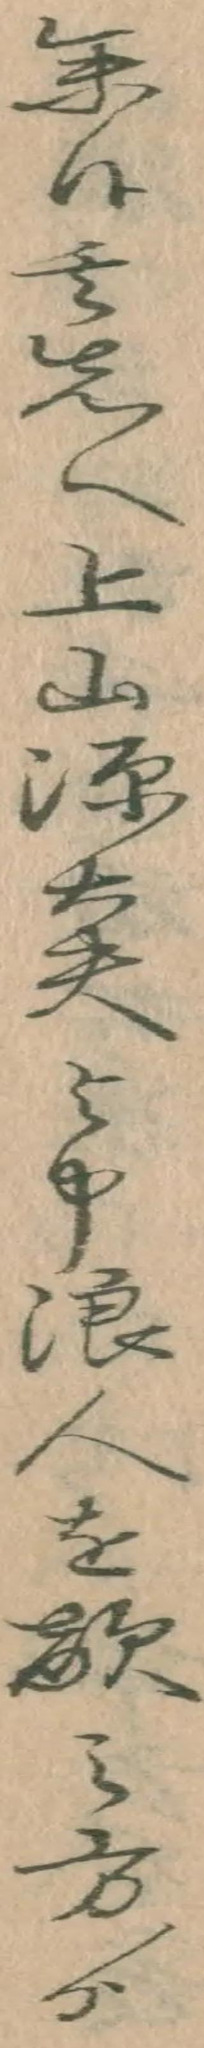参候其先へ上山源太夫与申浪人を敵之方ゟ
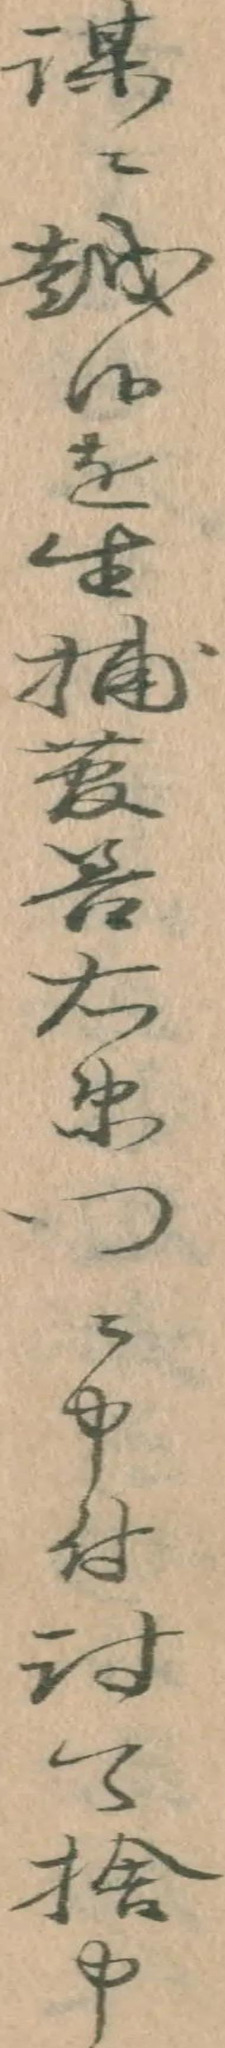謀に越候を生捕管善右衛門に申付討て捨申
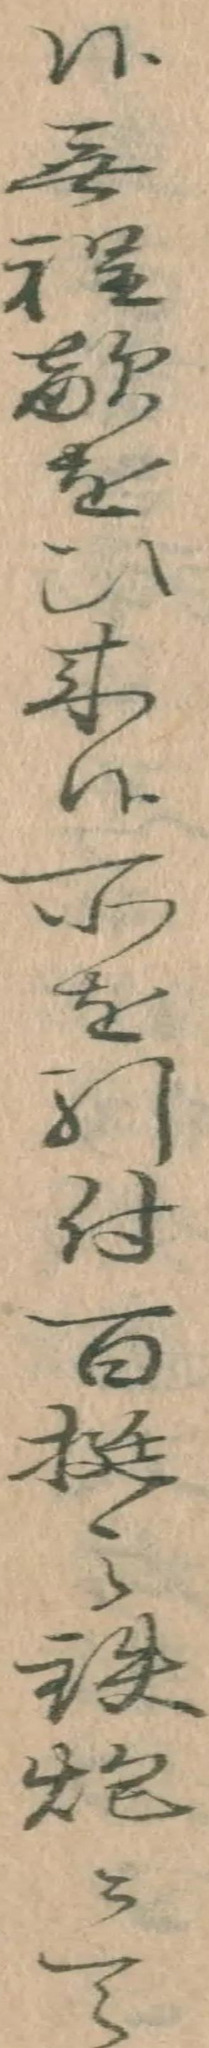候無程敵をひ来候所を引付百挺之鉄炮にて
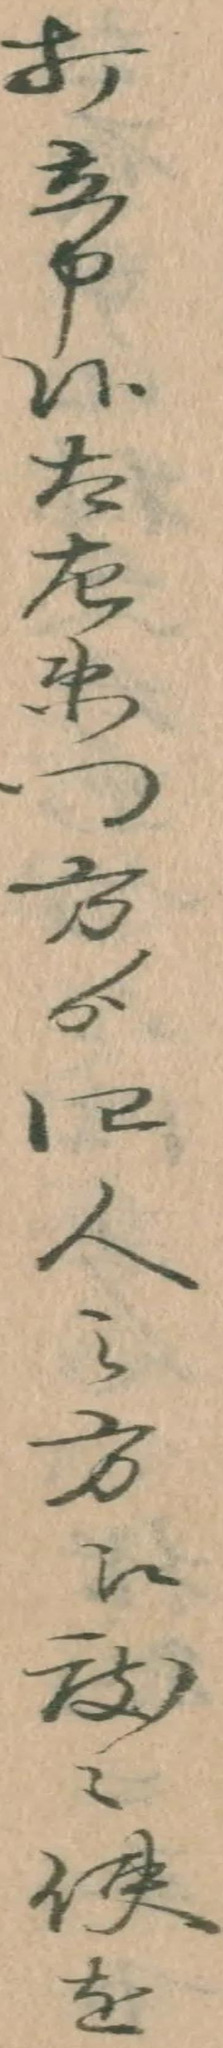打立申候太左衛門方ゟ四人之方江度々使を
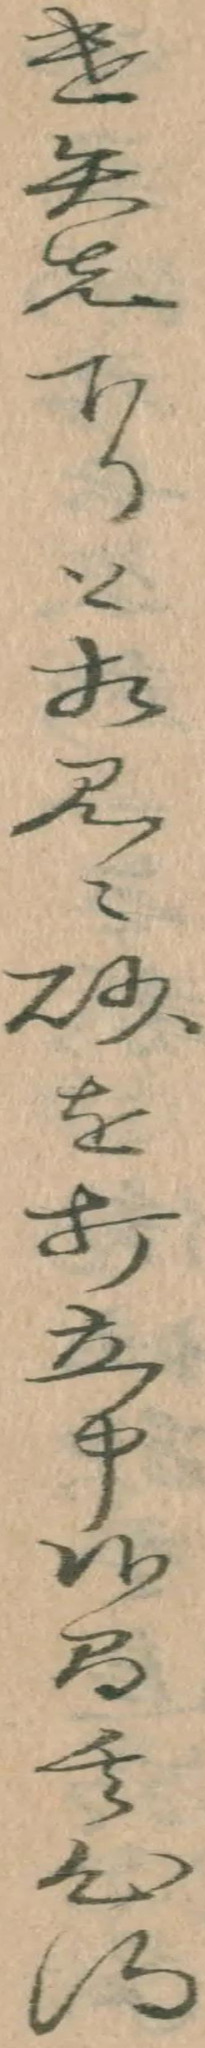遣矢先下りと相見に砂を打立申候間其心得
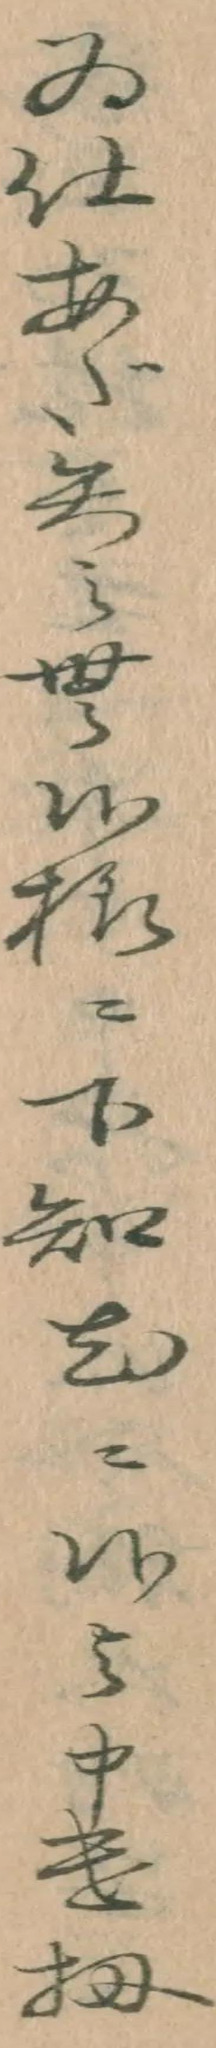ゐ仕あだ矢之無候様に下知尤に候与申遣扨
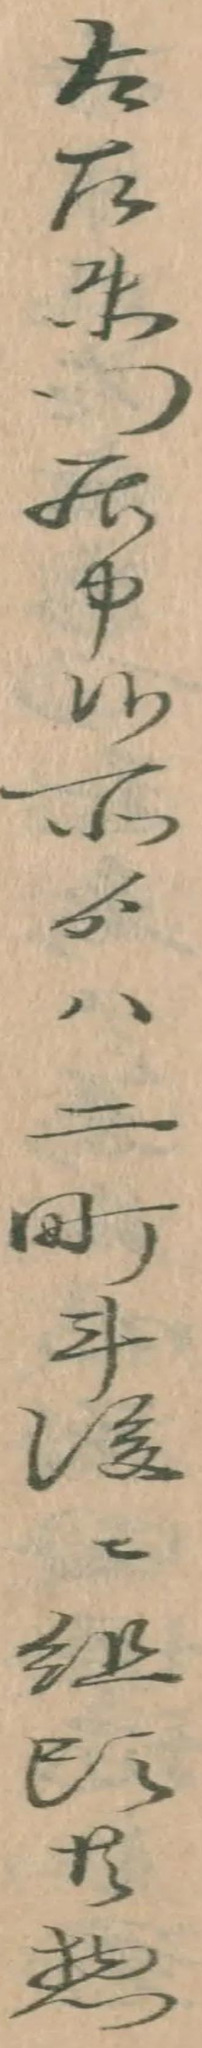太左衛門居申候所ゟは二町斗後に組頭共惣
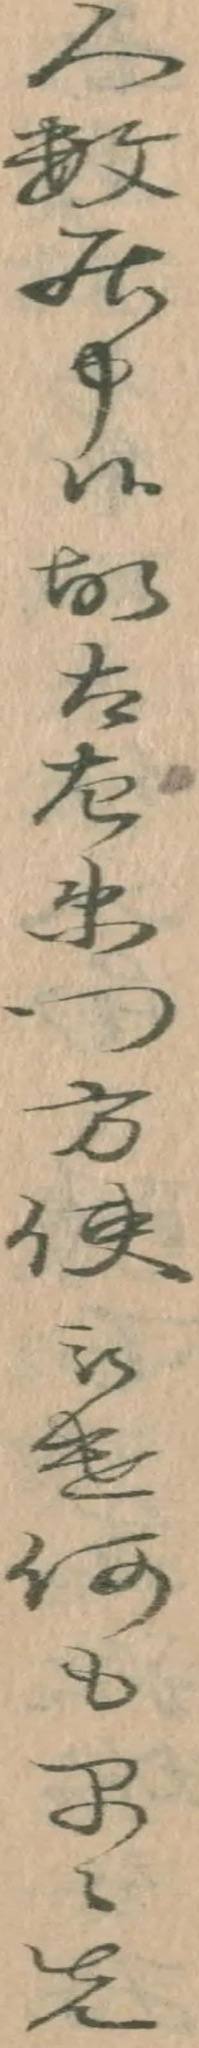人数居申候故太左衛門方使被遣何も早々先
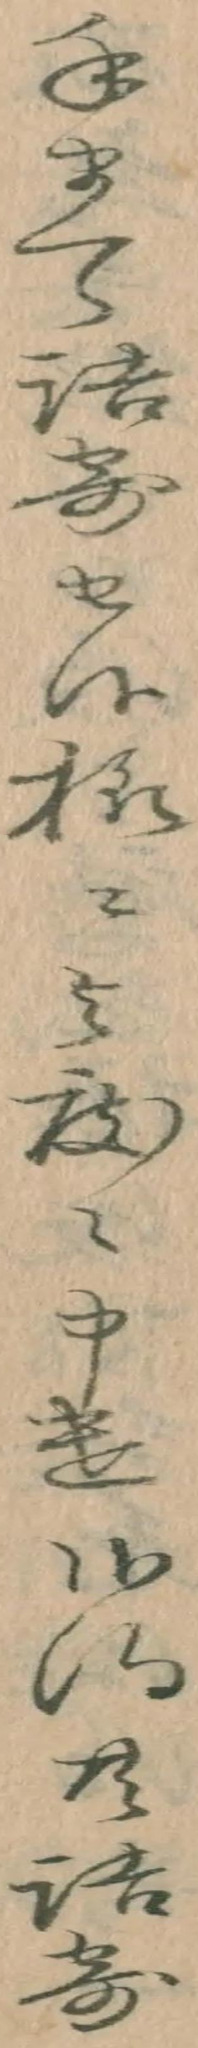手まて詰寄せ候様に与度々申遣候得共詰寄
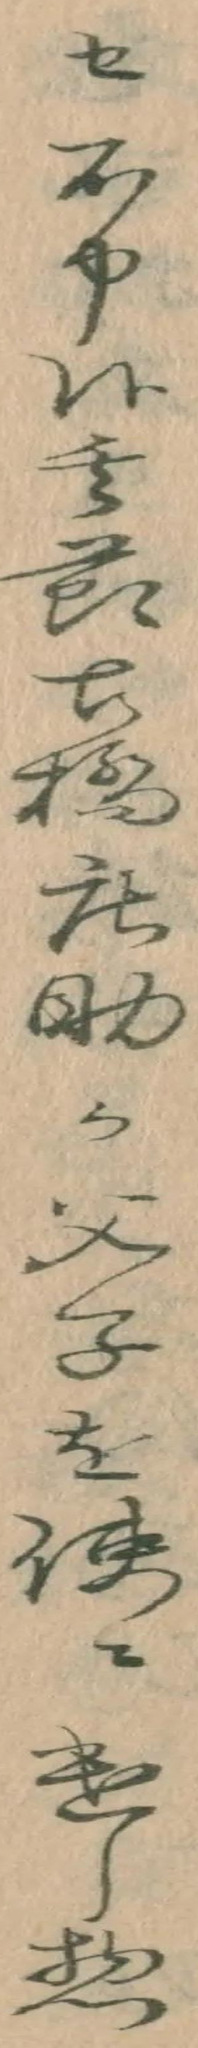せ不申候其節古橋庄助か父子を使に遣し惣
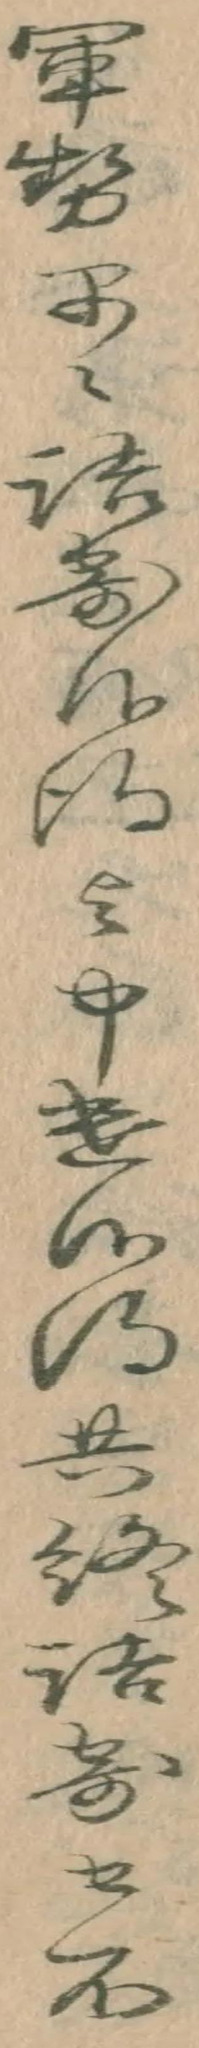軍勢早々詰寄候得与申遣候得共終詰寄せ不
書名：切支丹御退治記 49巻. [2]
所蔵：国立国会図書館 National Diet Library, JAPAN
